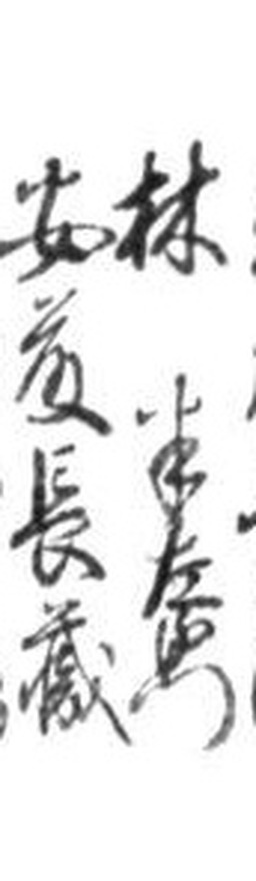安藤長蔵
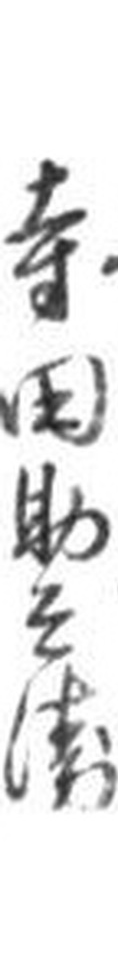寺田助兵衛
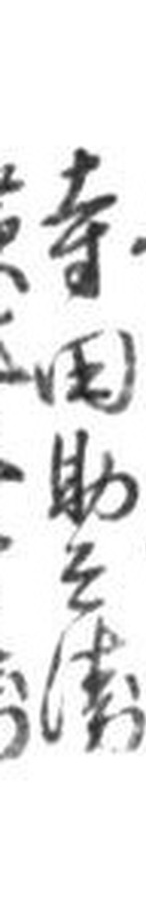寺田助兵衛
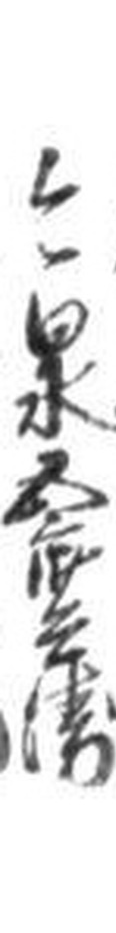今泉五郎兵衛
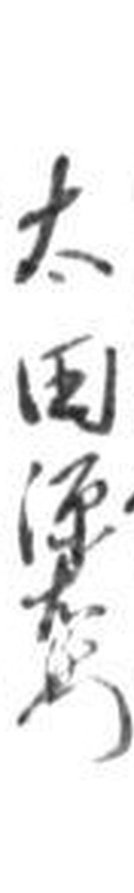太田源右衛門
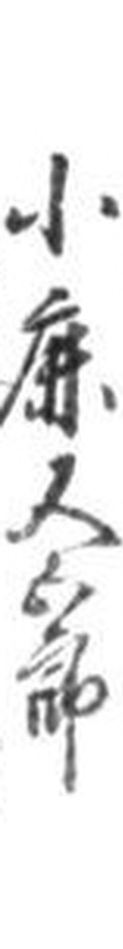小鹿又五郎
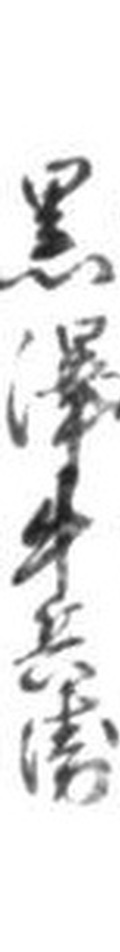黒沢牛兵衛
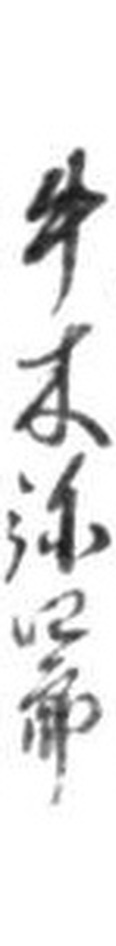牛木弥四郎
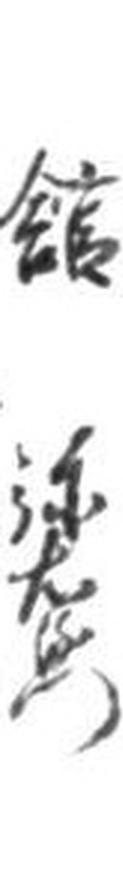館弥右衛門
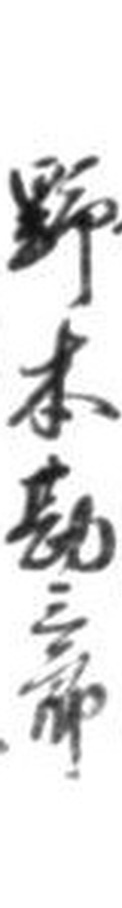野本勘三郎
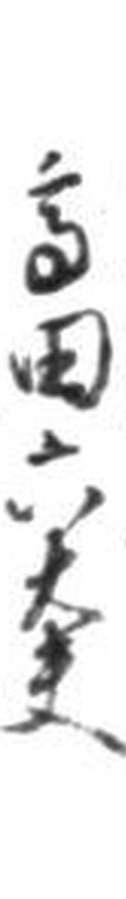高田六大夫
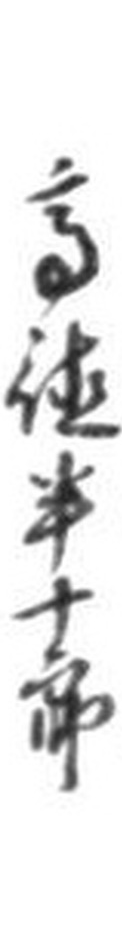高徳半十郎
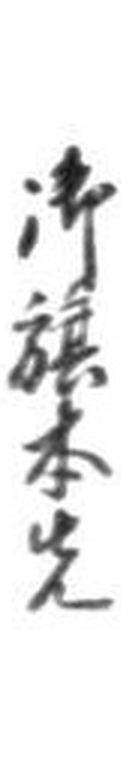御旗本先
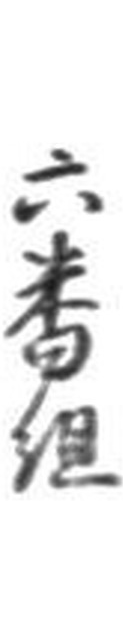六番組
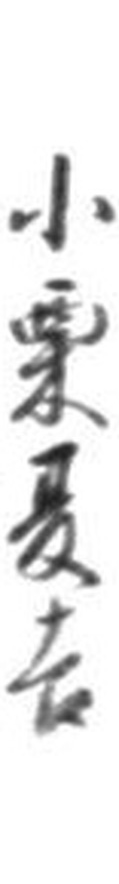小栗夏吉
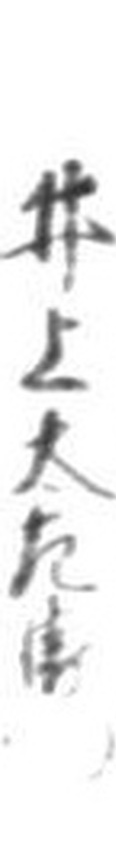井上太左衛門
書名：家譜 二 忠直公 従文禄四年到慶安四年
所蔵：福井県文書館 Fukui Prefectural Archives
